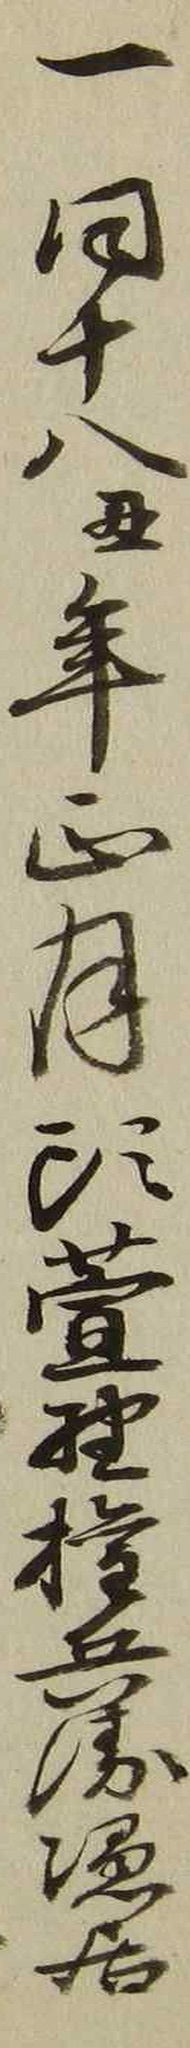一同十八丑年正月頭萱野権兵候衛隠居
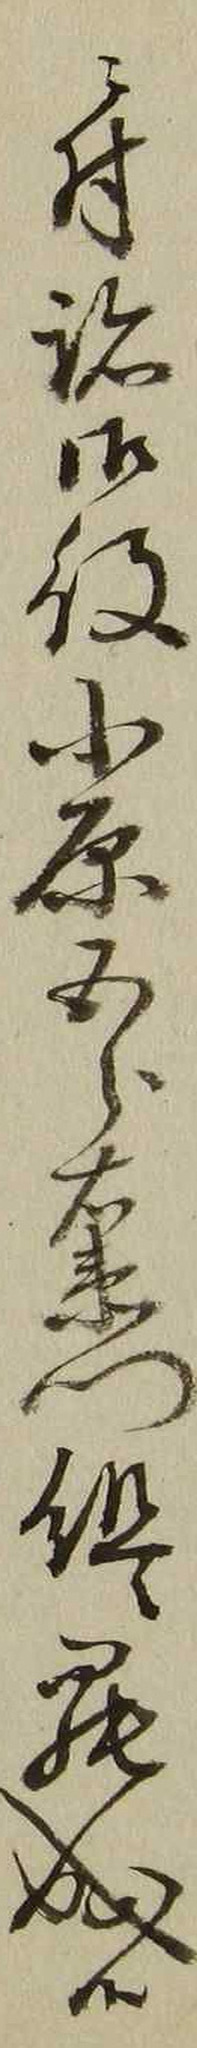ニ付跡御役小原五郎右衛門組ニ罷成候
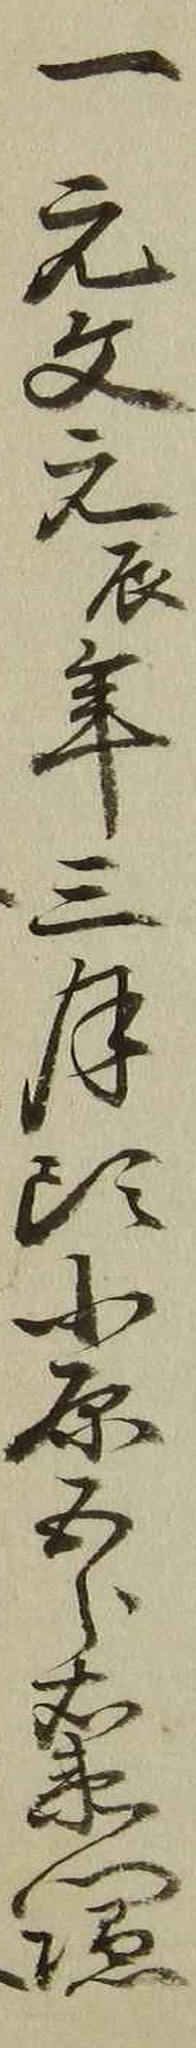一元文元辰年三月頭小原五郎右衛門隠
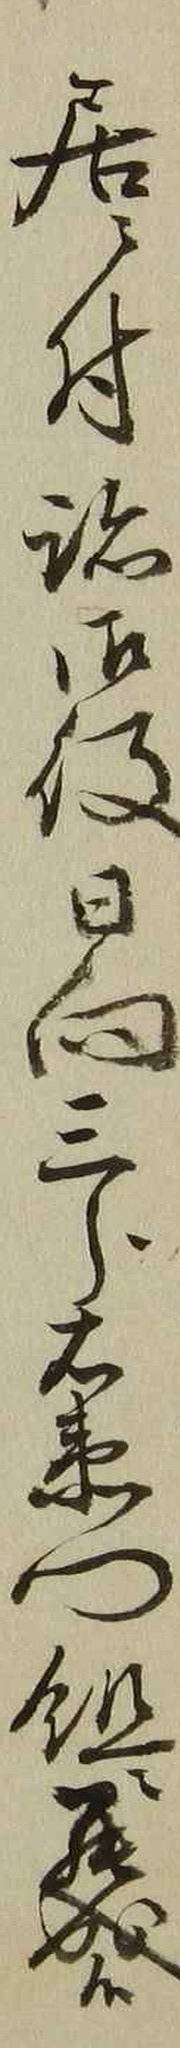居ニ付跡御役日向三郎右衛門組ニ罷成候
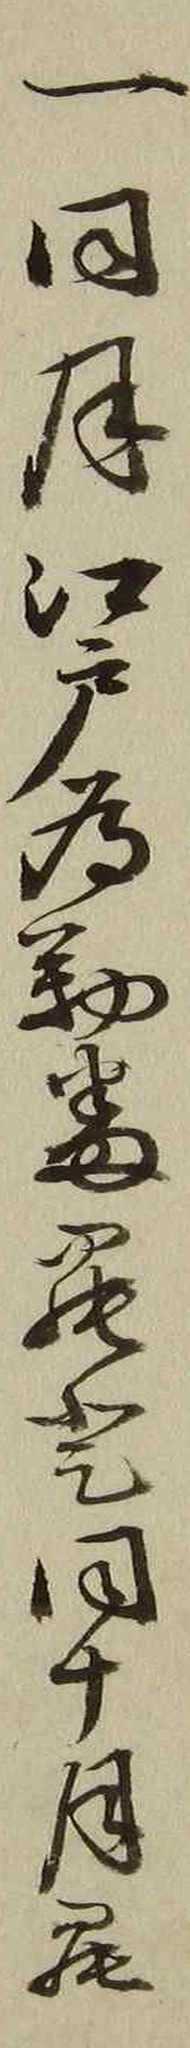一同月江戸為勤番罷登同十月罷
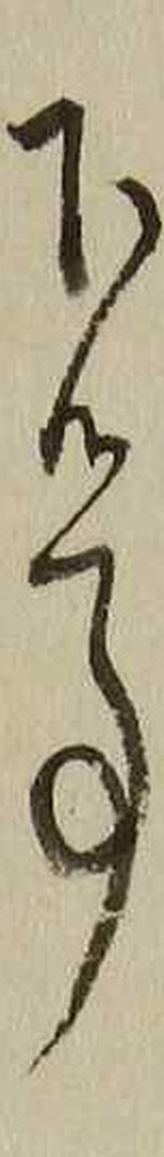下候事
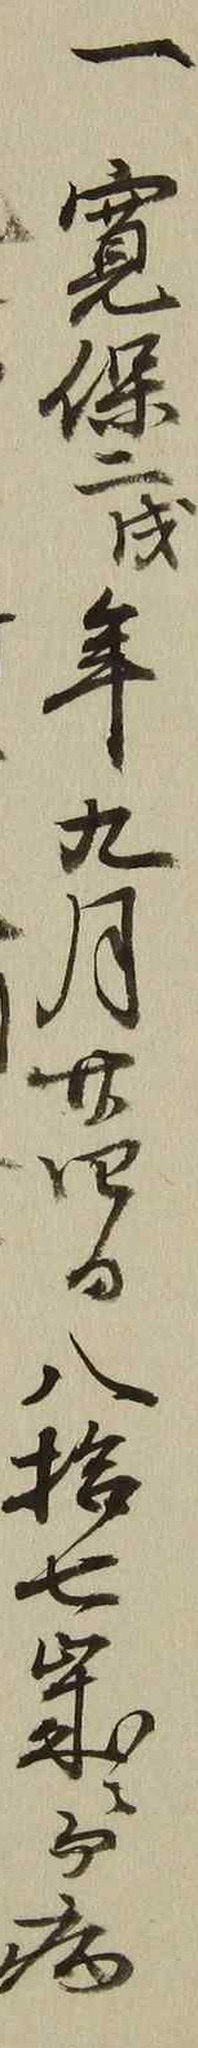一寛保二戌年九月廿四日八拾七歳ニ而病
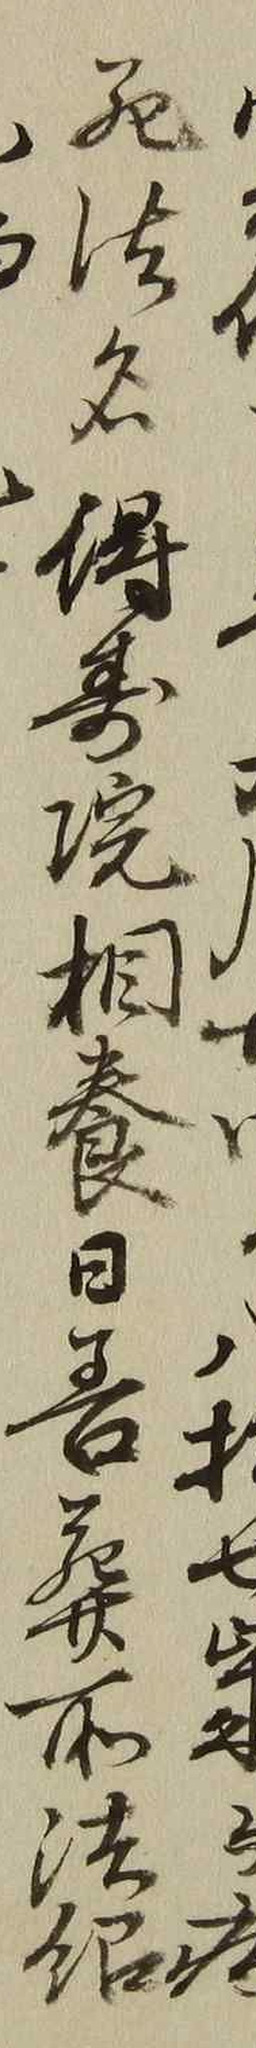死法名得寿院相養日善葬所法紹
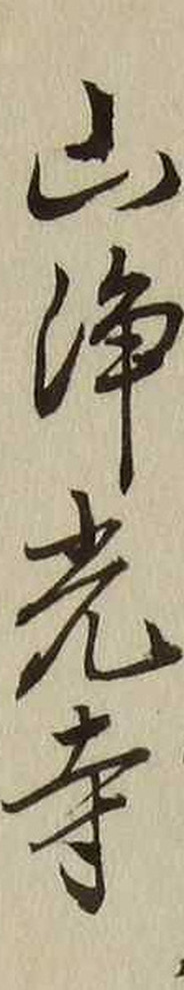山浄光寺
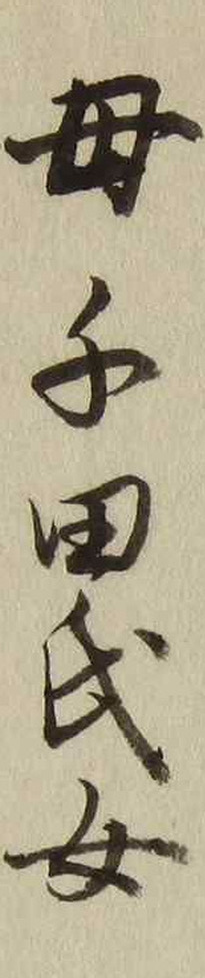母千田氏女
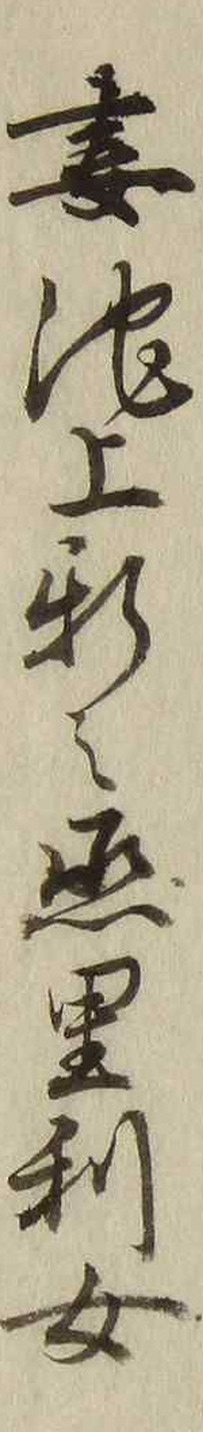妻池上新之丞里利女

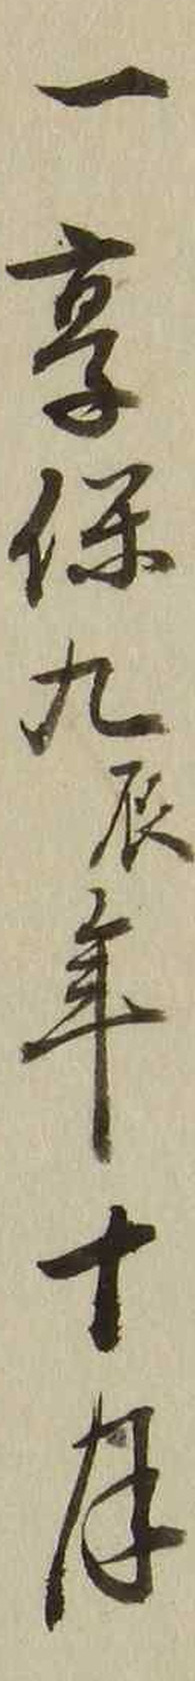一享保九辰年十月
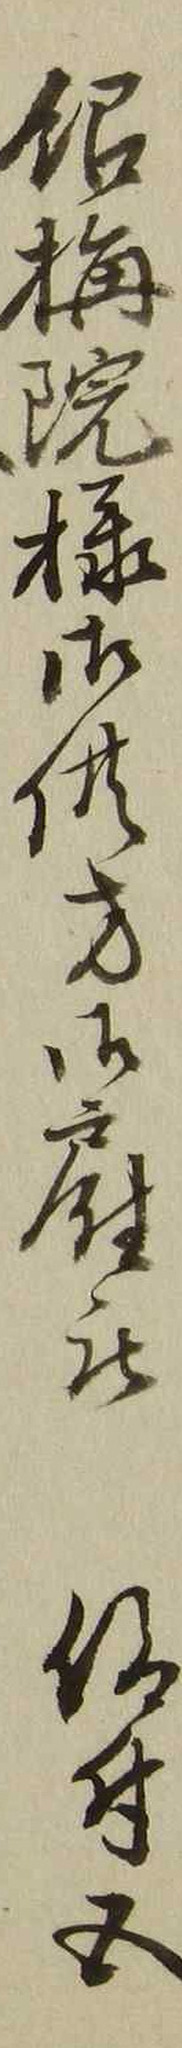紹栴院様御供方御雇被仰付五
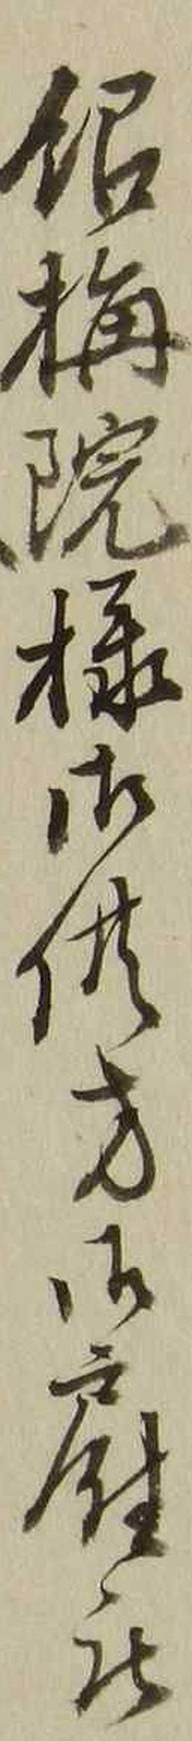紹栴院様御供方御雇被仰付五
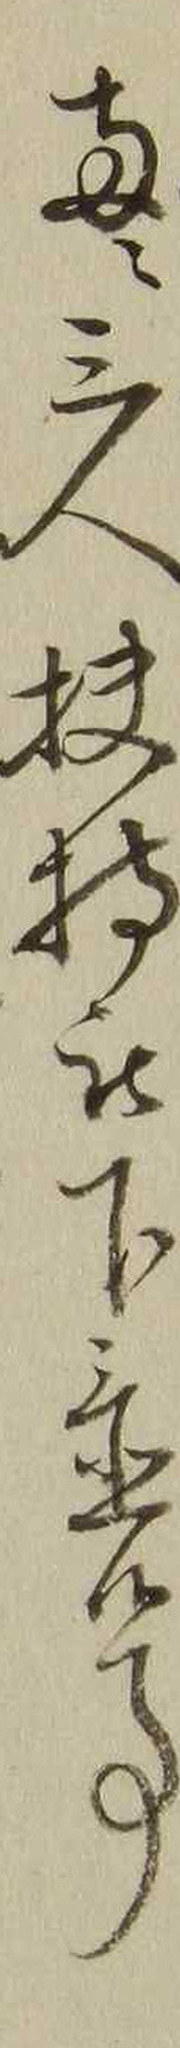両ニ三人扶持被下置候事
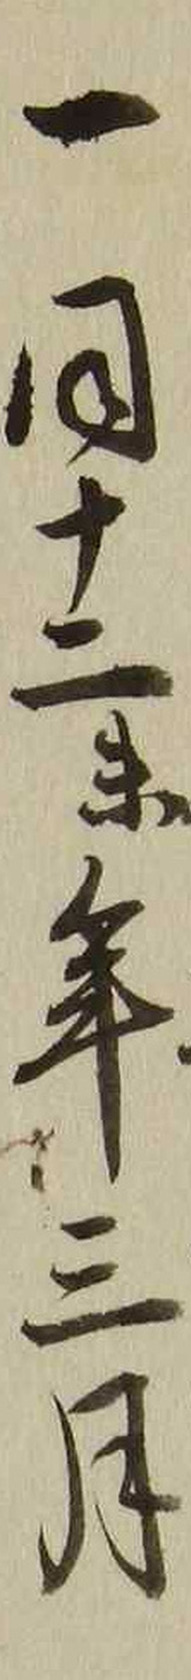一同十二未年三月
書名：諸士系譜　巻之35　は之部3
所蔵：会津若松市立会津図書館
